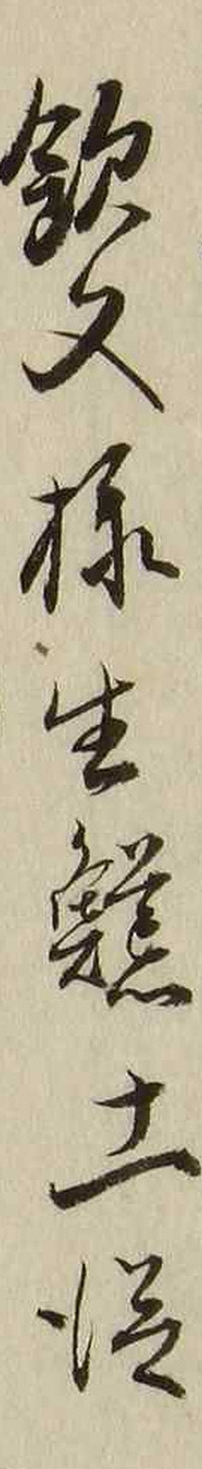欽文様生𩺊十一従
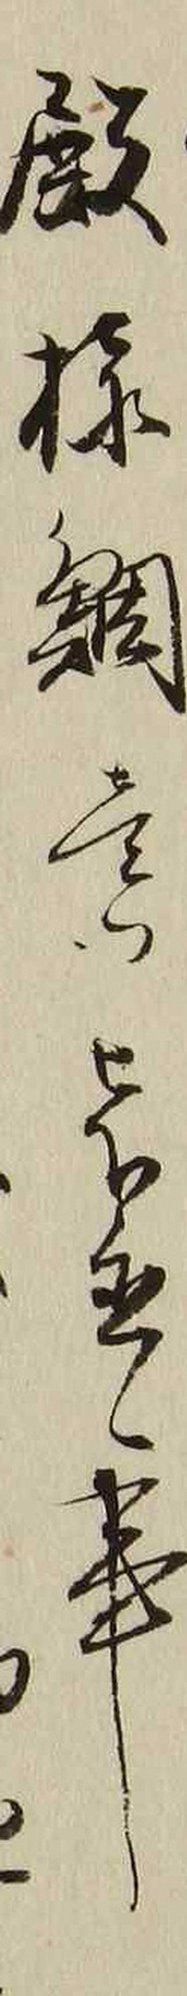殿様鯛壱つ被下置候事
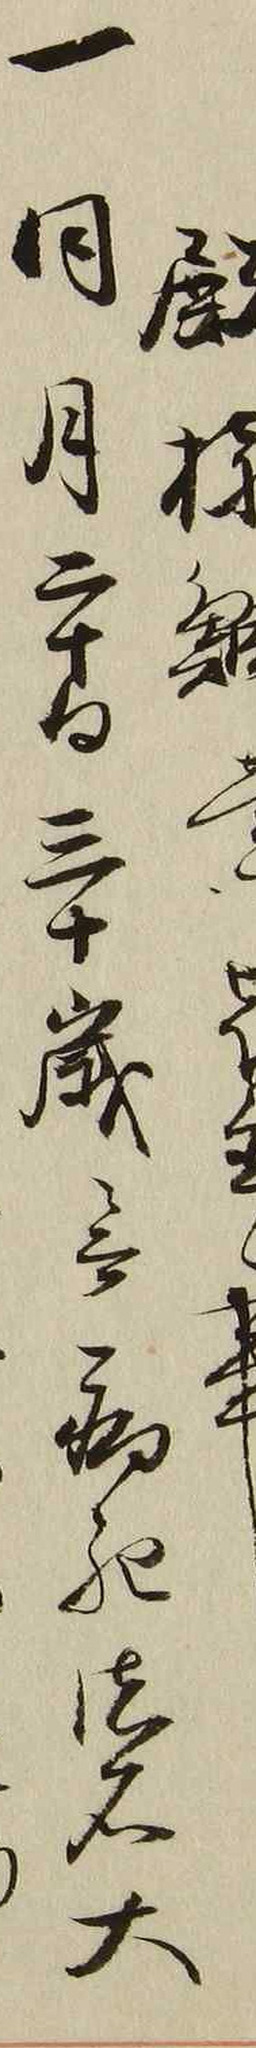一同月二十日三十歳に而病死法名大
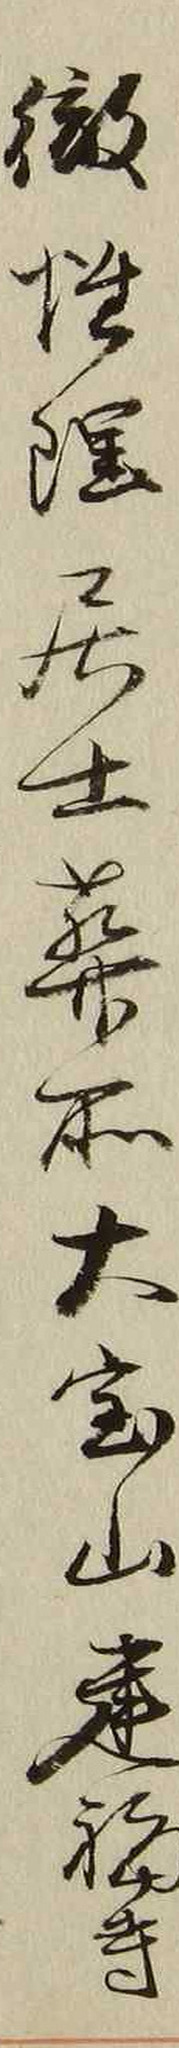微性陰居士葬所大宝山建福寺
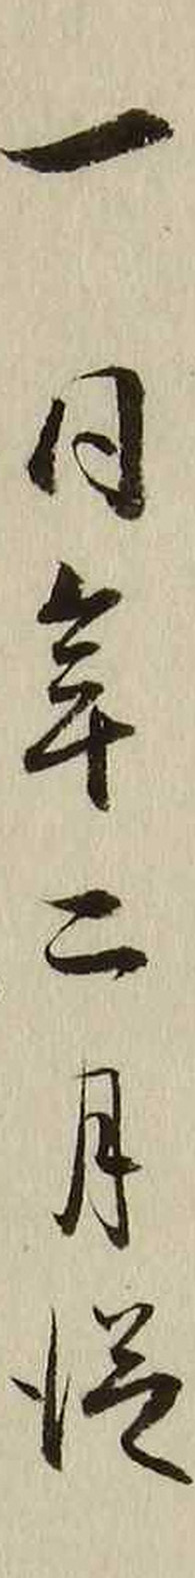一同年二月従
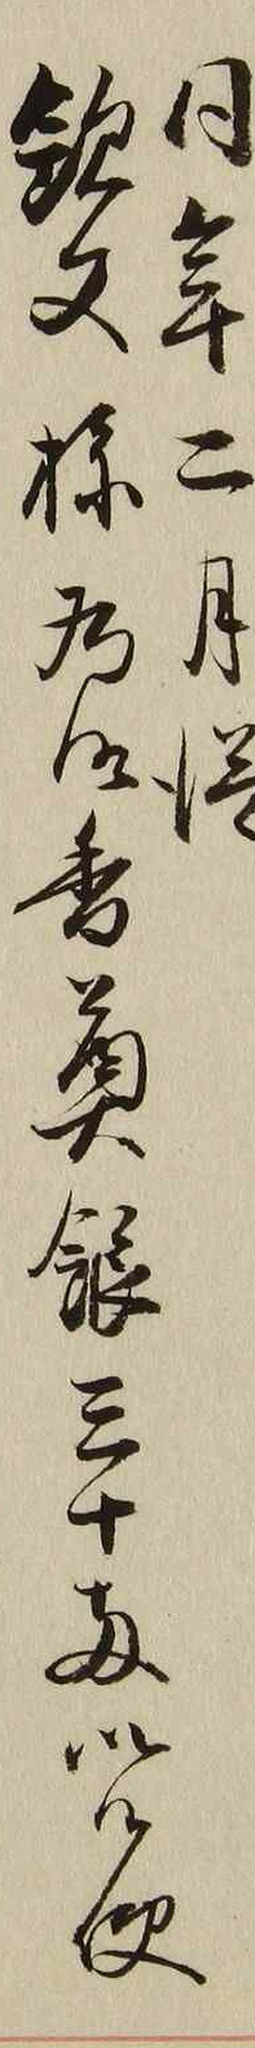欽文様為御香奠銀三十両以御使
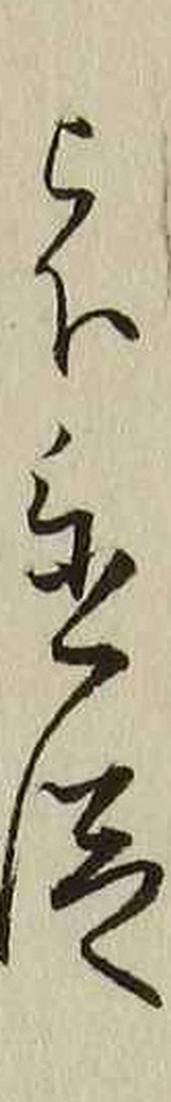被下置従
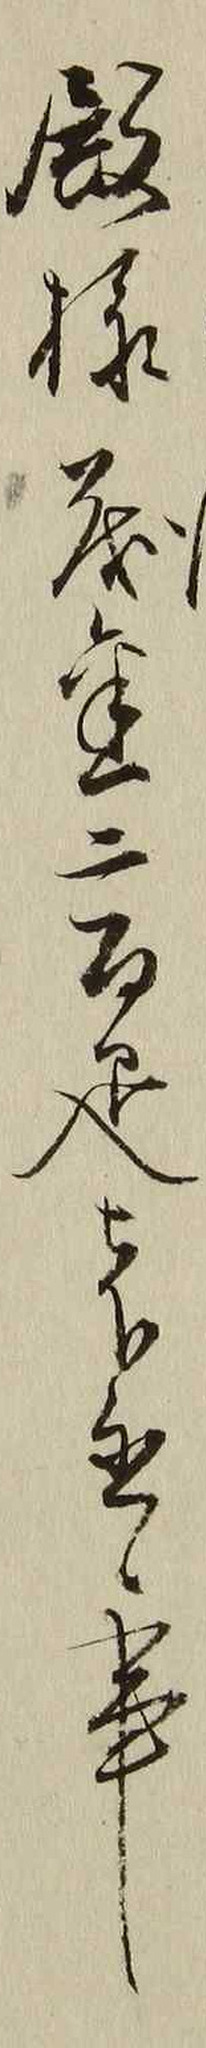殿様も金二百疋被下置候事
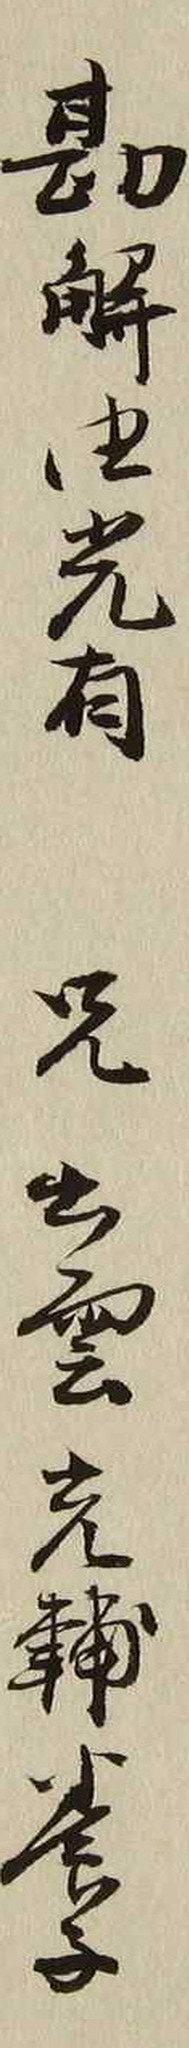勘解由光有兄出雲光輔養子
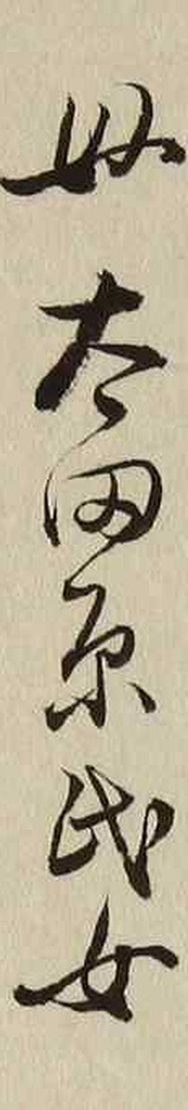母大田原氏女
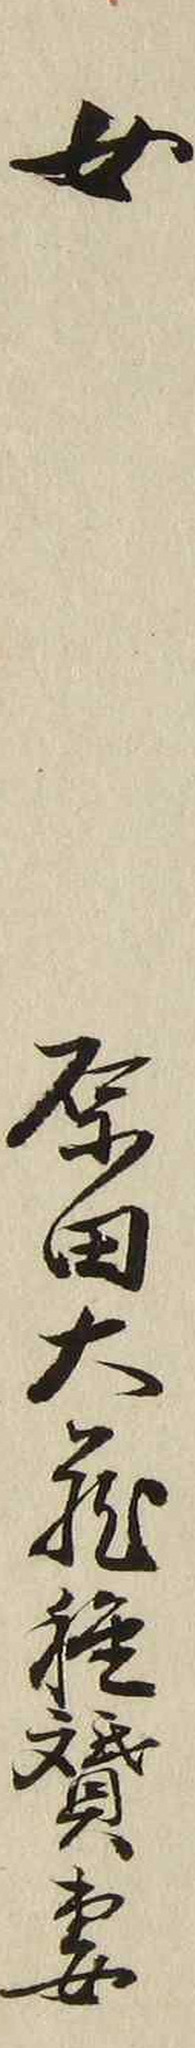女原田大蔵種贇妻
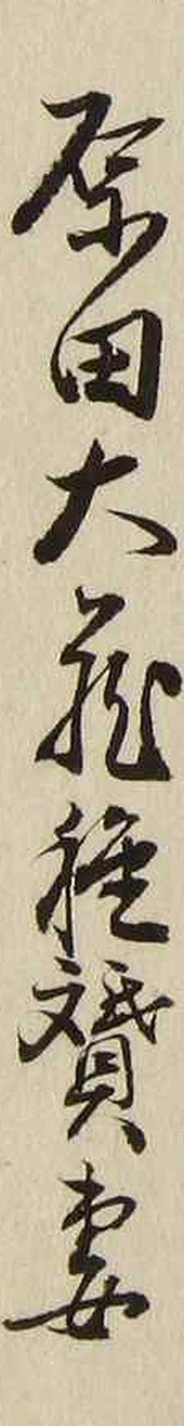女原田大蔵種贇妻

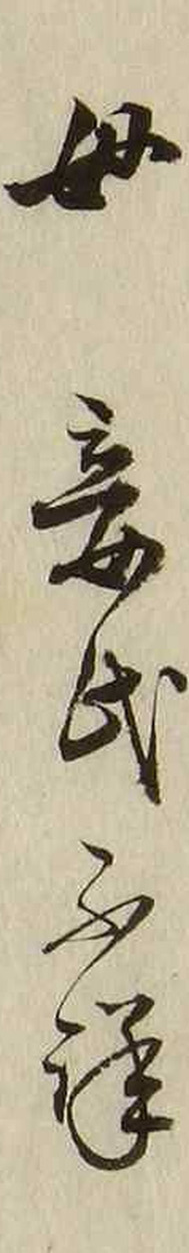女妾氏不詳
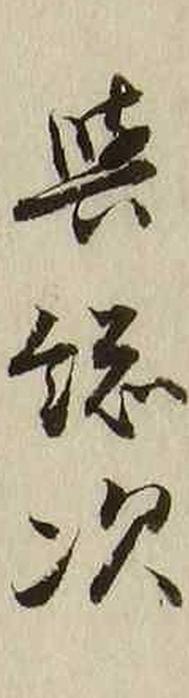輿総次
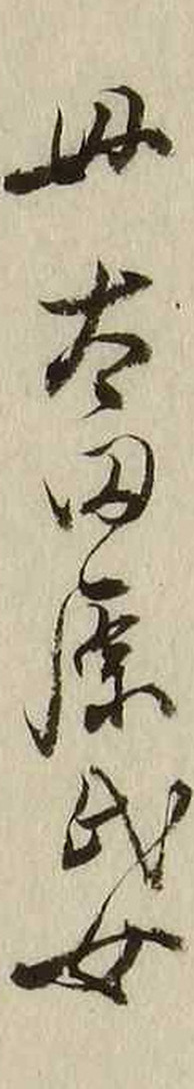母大田原氏女
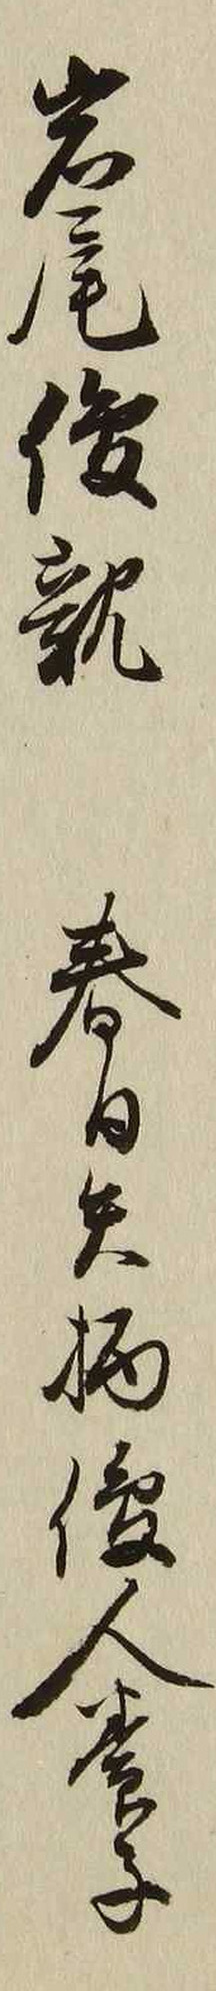岩尾俊親春日矢柄俊人養子
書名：諸士系譜　巻之292　き之部1
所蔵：会津若松市立会津図書館
